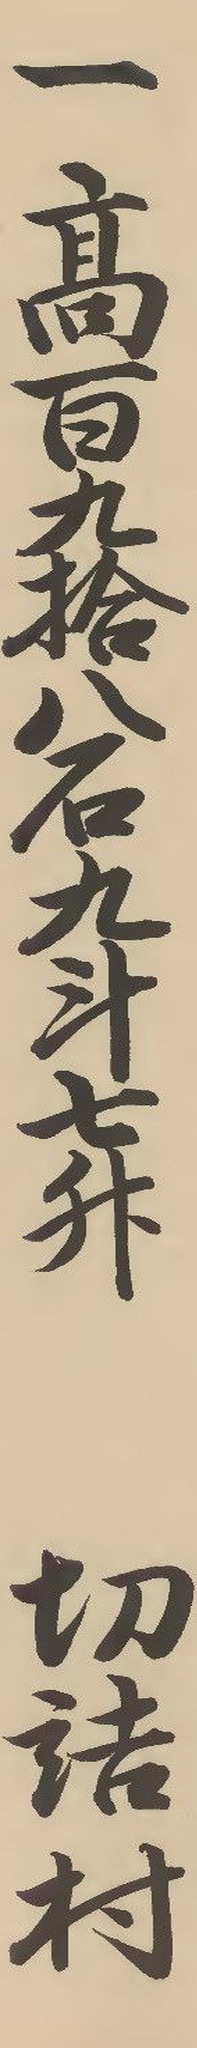一高百九拾八石九斗七升切詰村
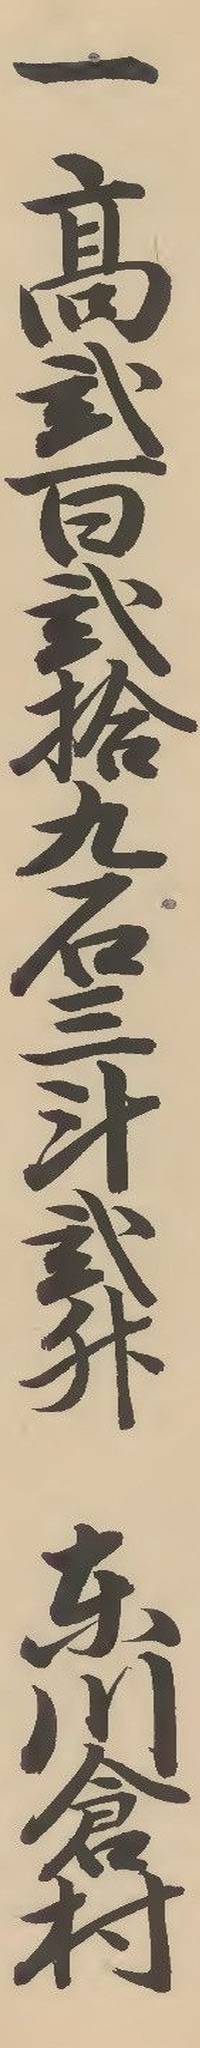一高弐百弐拾九石三斗弐升東川倉村

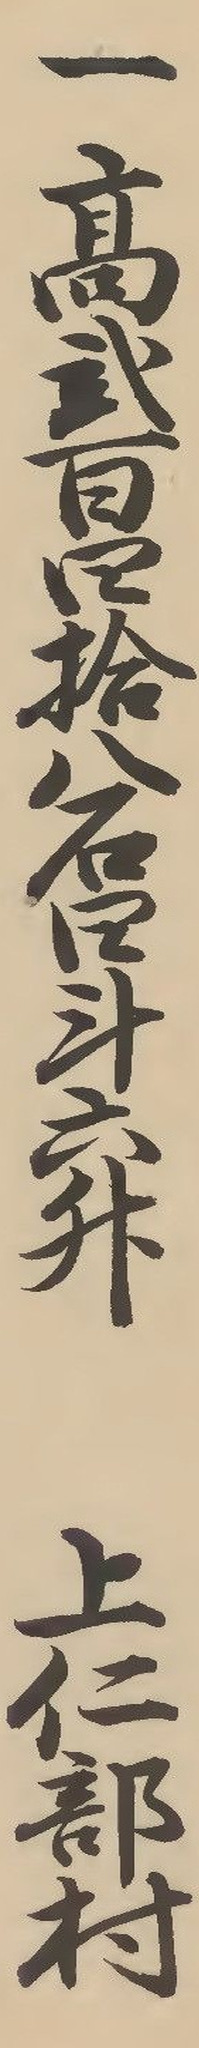一高弐百四拾八石四斗六升上仁部村
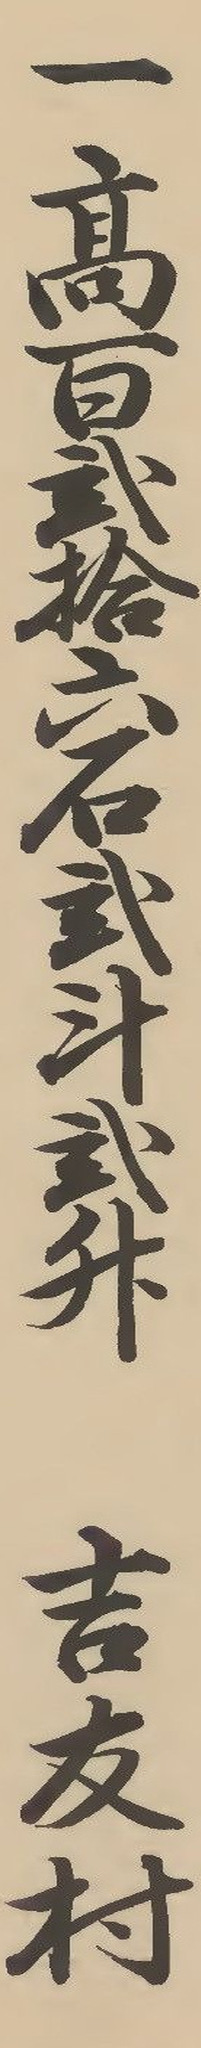一高百弐拾六石弐斗弐升吉友村
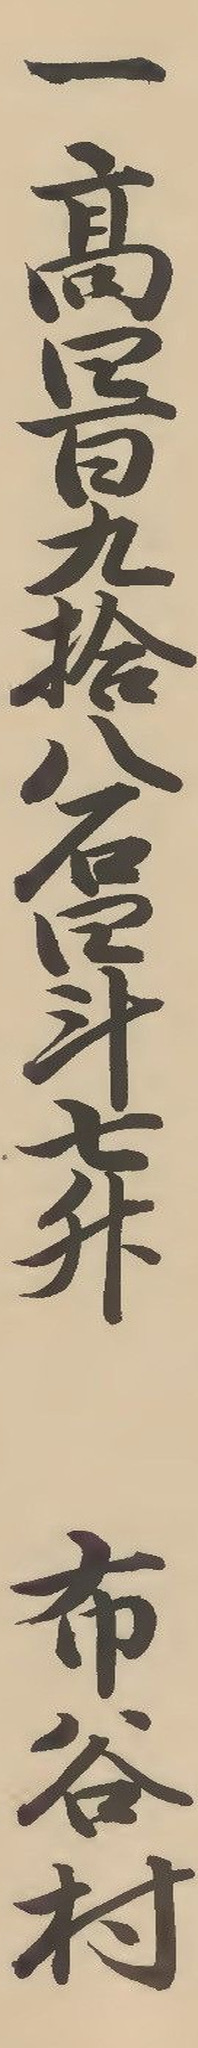一高四百九拾八石四斗七升布谷村
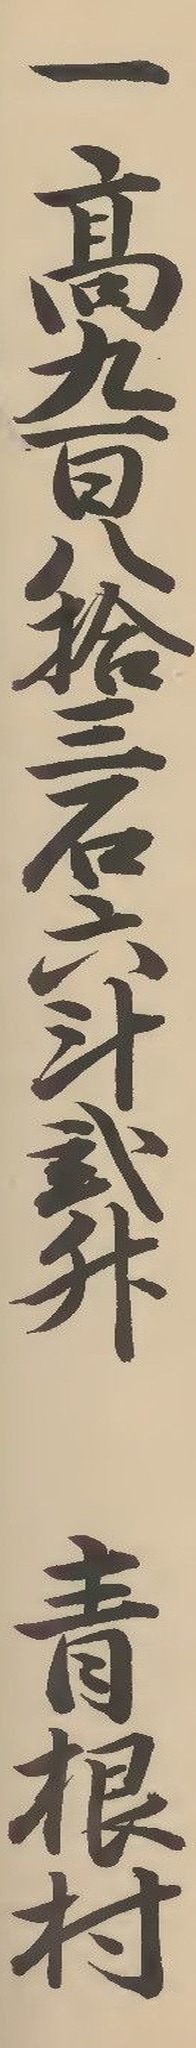一高九百八拾三石六斗弐升青根村
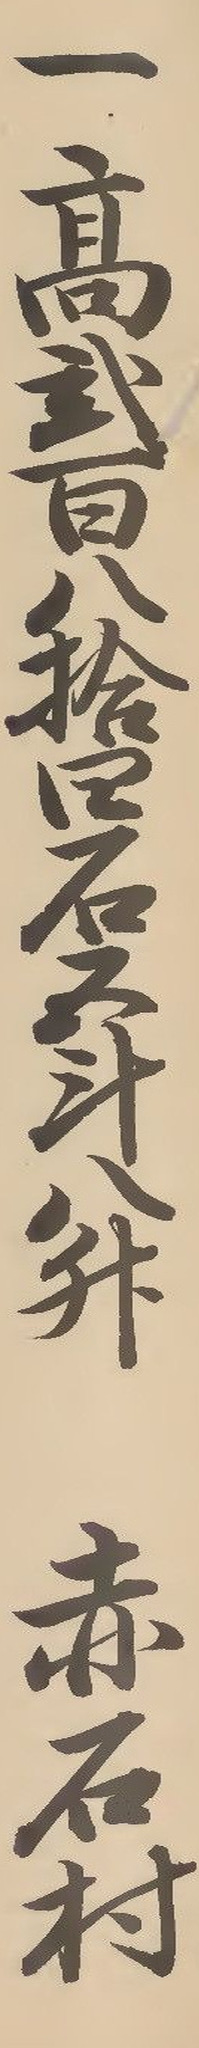一高弐百八拾四石五斗八升赤石村
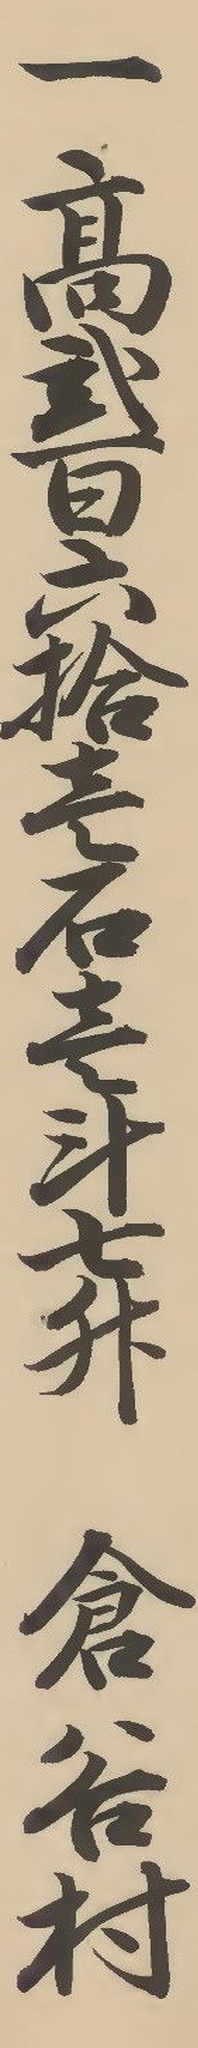一高弐百六拾壱石壱斗七升倉谷村
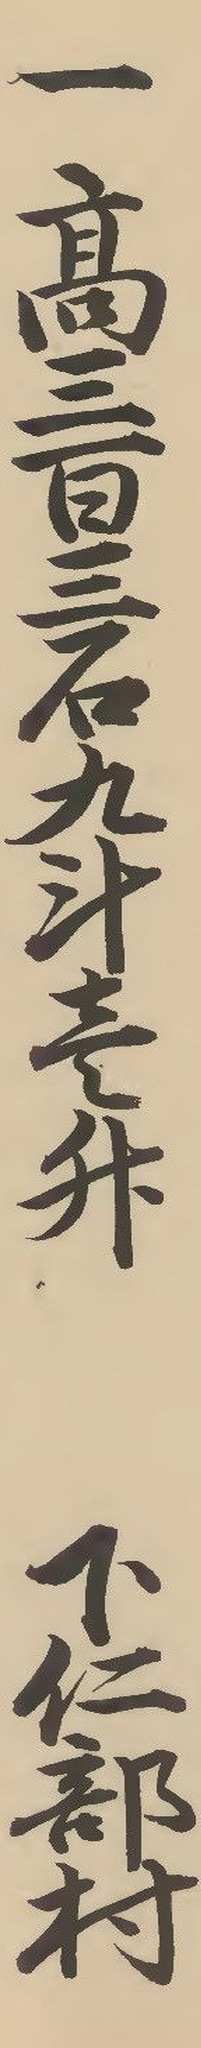一高三百三石九斗壱升下仁部村
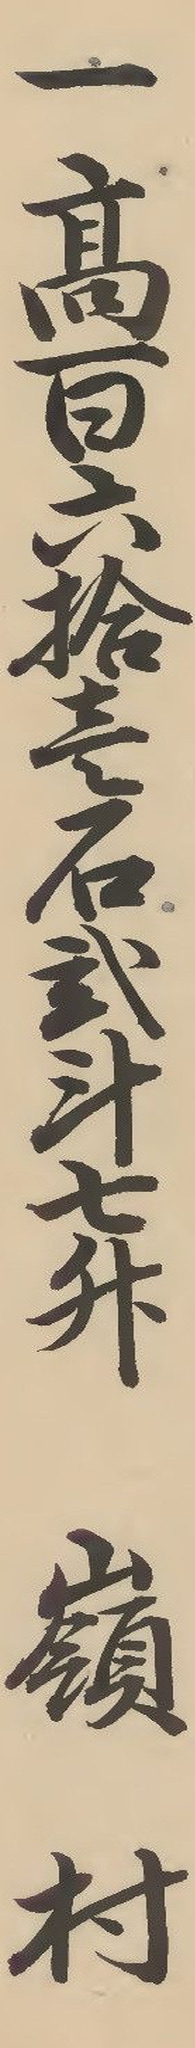一高百六拾壱石弐斗七升嶺村

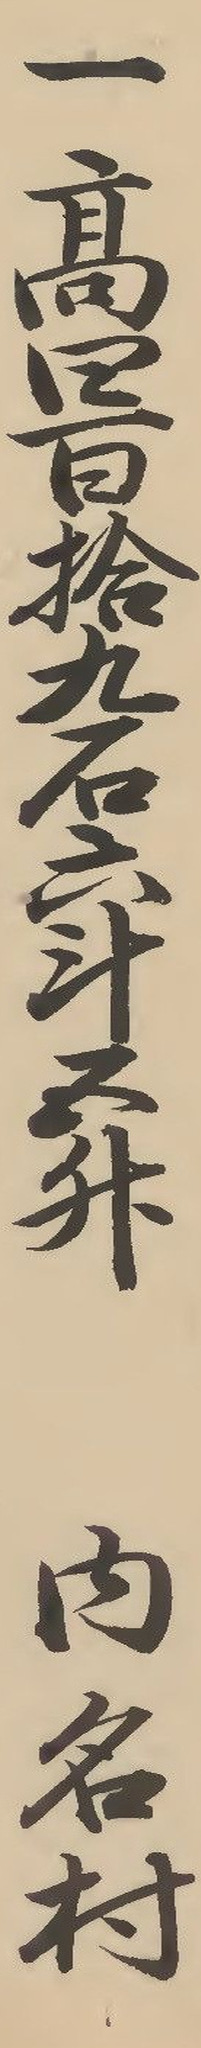一高四百拾九石六斗五升内名村
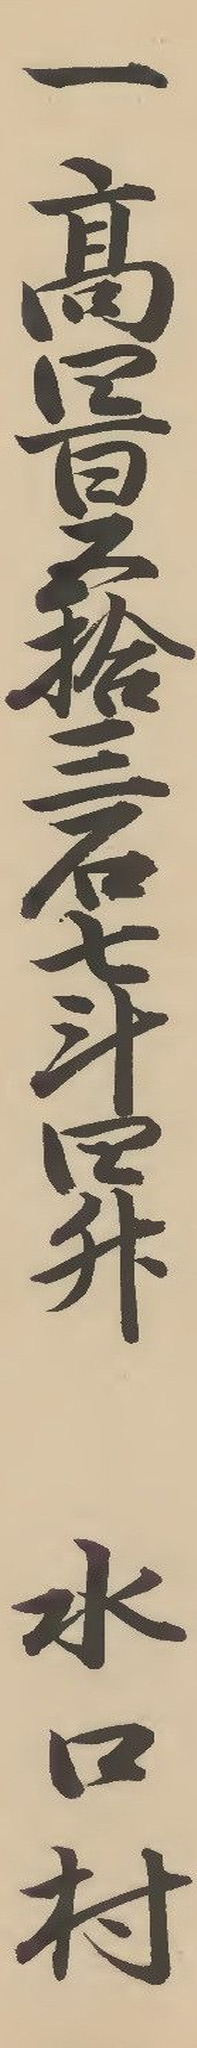一高四百五拾三石七斗四升水口村
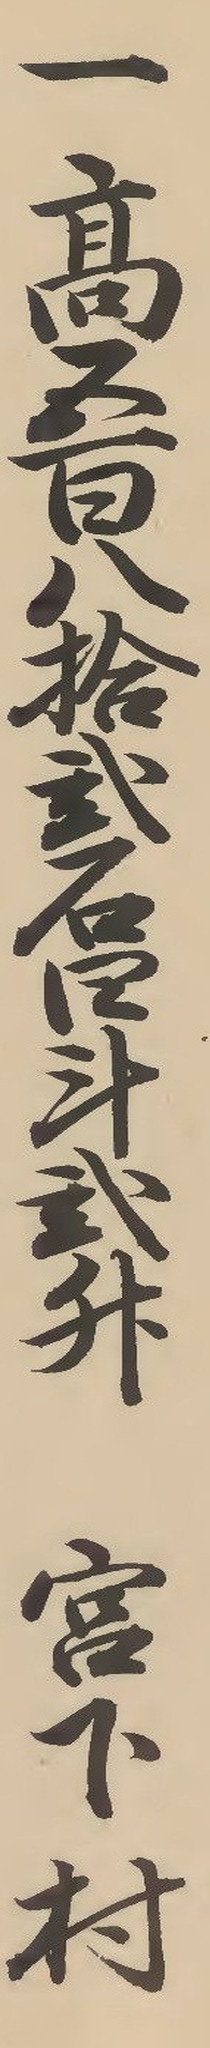一高五百八拾弐石四斗弐升宮下村
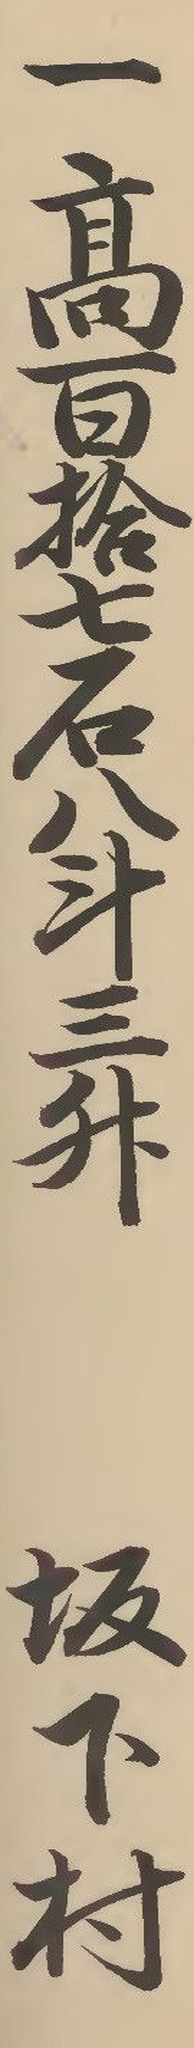一高百拾七石八斗三升坂下村
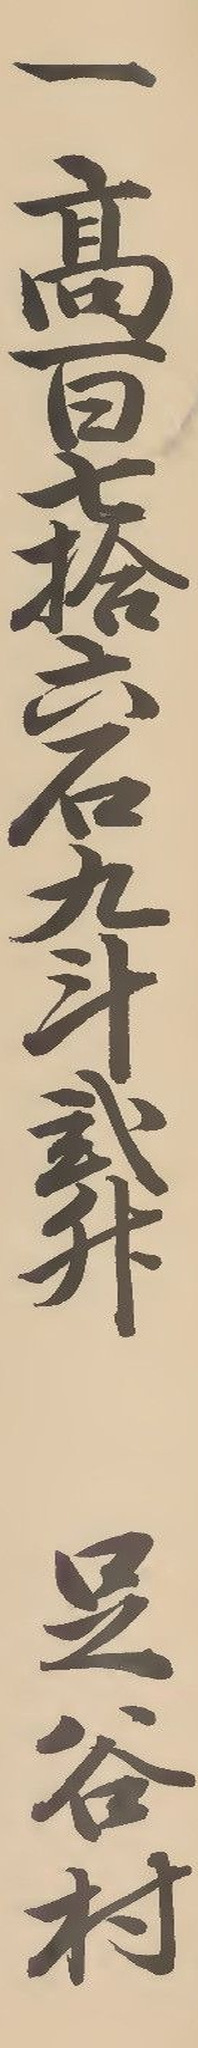一高百七拾六石九斗弐升足谷村
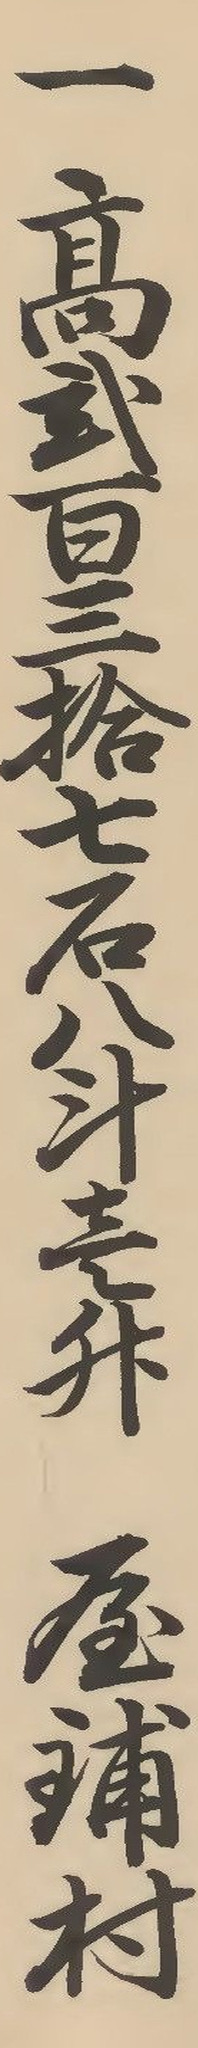一高弐百三拾七石八斗壱升屋鋪村
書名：越中国郷帳
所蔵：国立公文書館 National Archives of Japan
